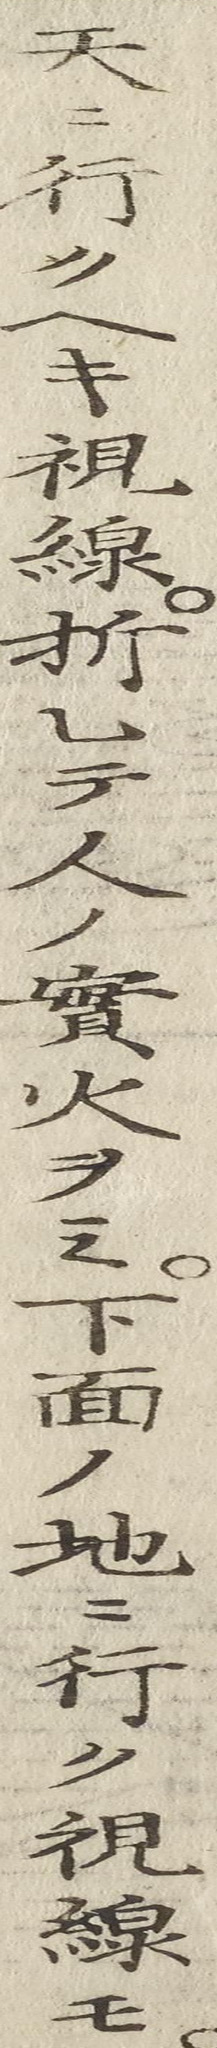天ニ行クヘキ視線。折レテ人ノノ実火ヲミ。下面ノ地ニ行ク視線モ。
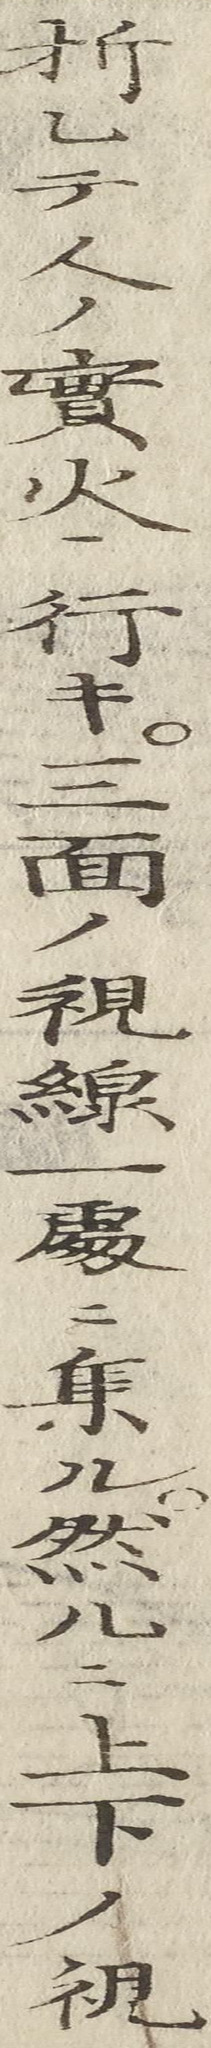折レテ人ノ実火ニ行キ。三面ノ視線一処ニ集ル。然ルニ上下ノ視
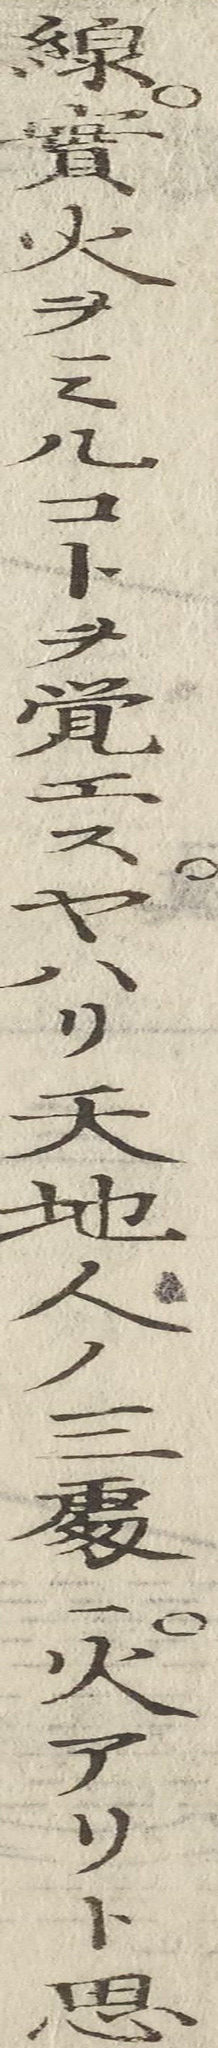線。実火ヲミルコトヲ覚エス。ヤハリ天地人ノ三処ニ。火アリト思
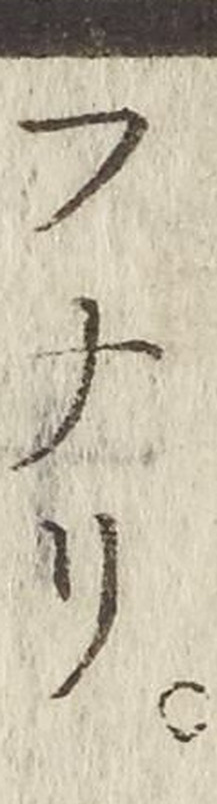フナリ。
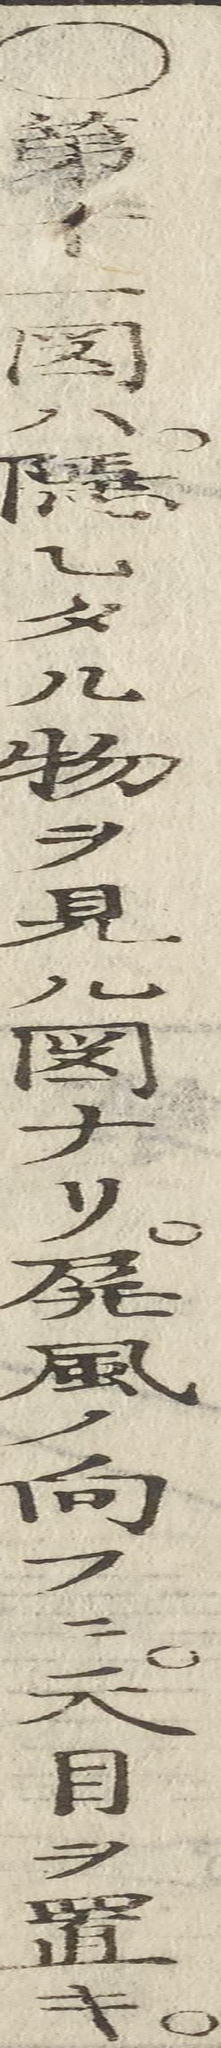○第十一図ハ。隠レタル物ヲ見ル図ナリ。屏風ノ向フニ。天目ヲ置キ。
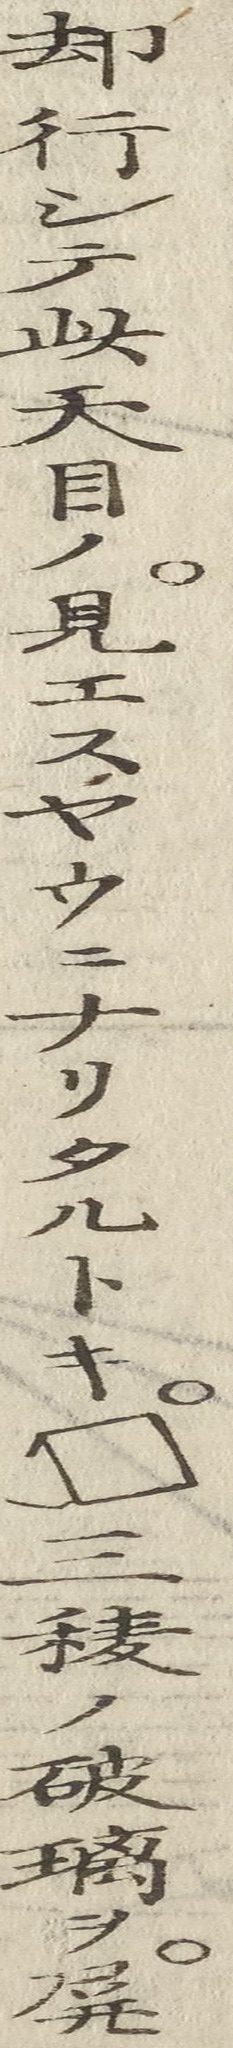却行シテ此天目ノ。見エスヤウニナリタルトキ。三稜ノ玻璃ヲ。屏
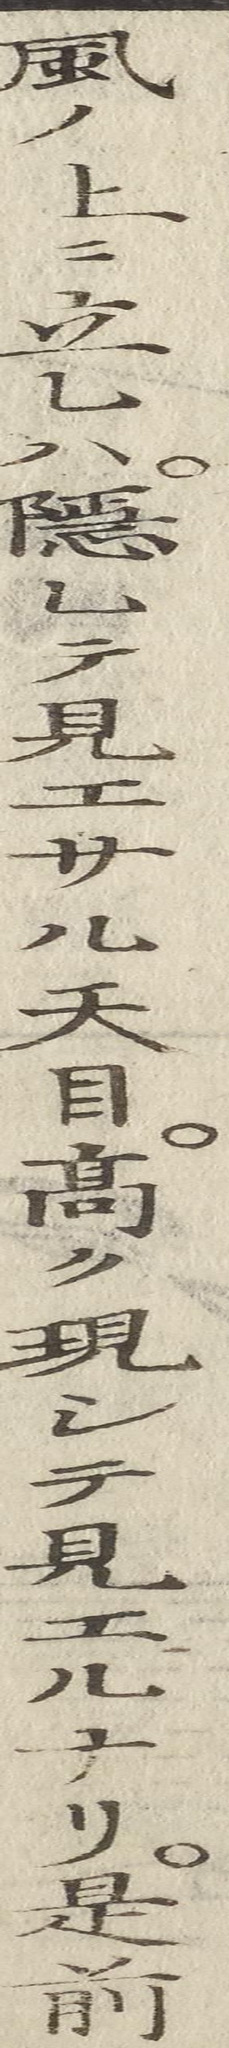風ノ上ニ立レハ。隠レテ見エサル天目。高ク現シテ見エルナリ。是前
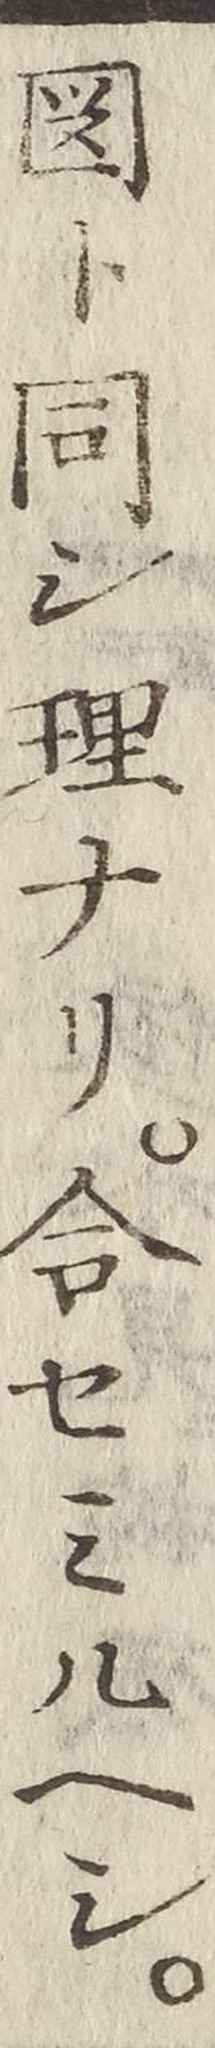図ト同シ理ナリ。合セミルヘシ。

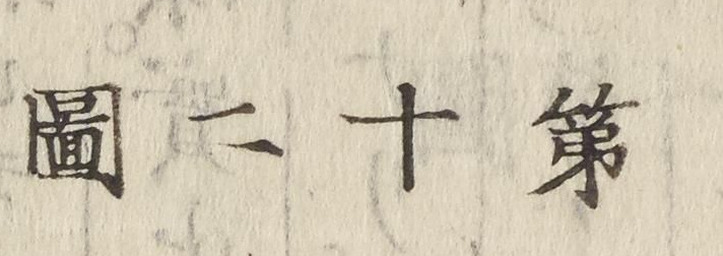第十二図
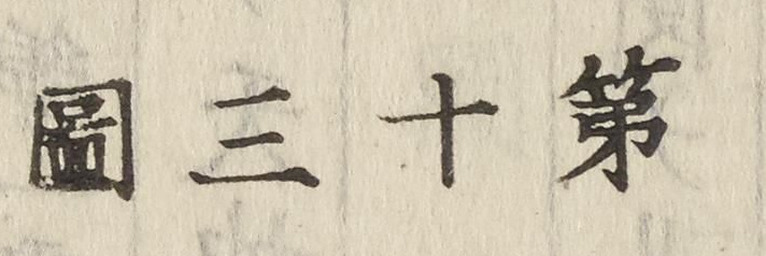第十三図
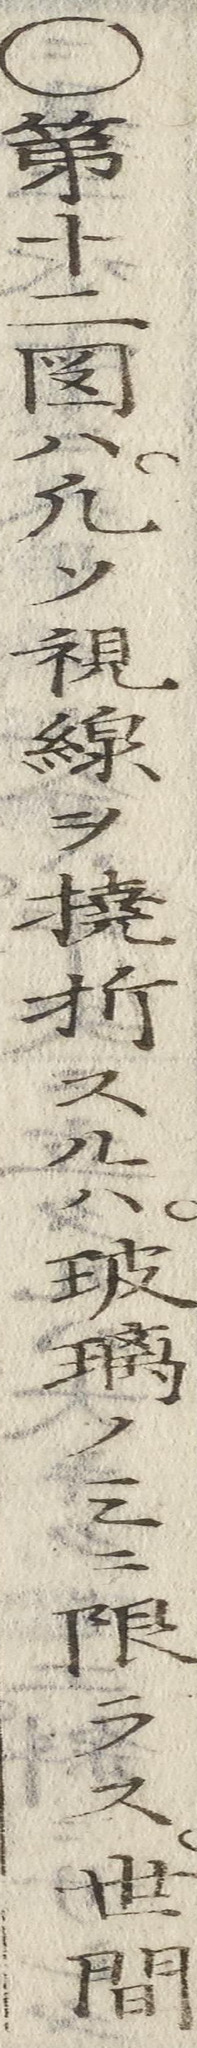○第十二図ハ。凡ソ視線ヲ撓折スルハ。玻璃ノミニ限ラス。世間
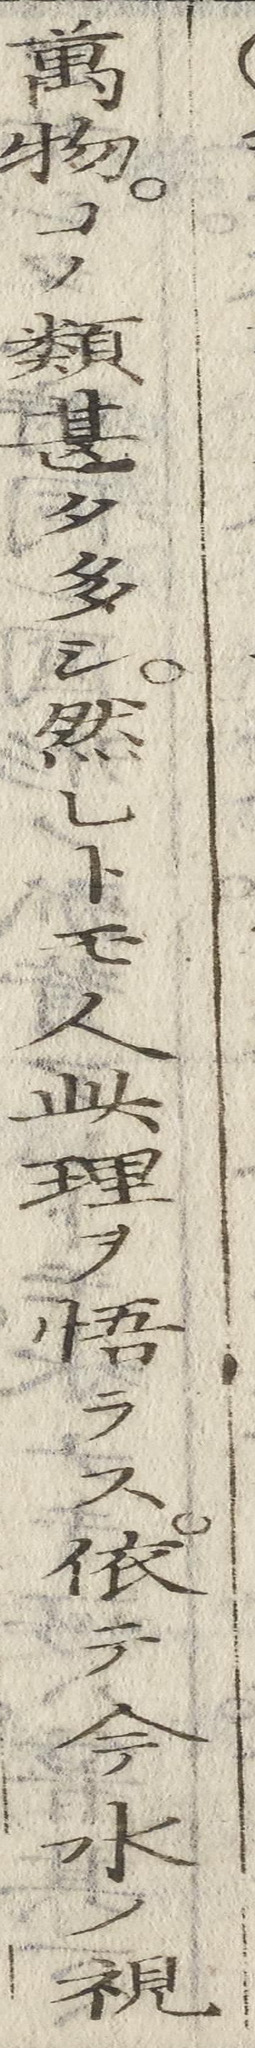万物。コノ類甚タ多シ。然レトモ人此理ヲ悟ラス。依テ今水ノ視
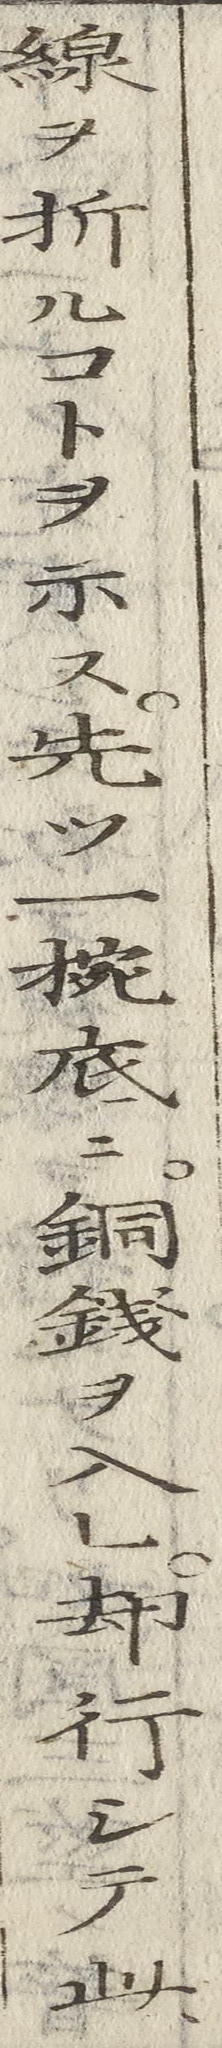線ヲ折ルコトヲ示ス。先ツ一椀底ニ。銅銭ヲ入レ。却行シテ此
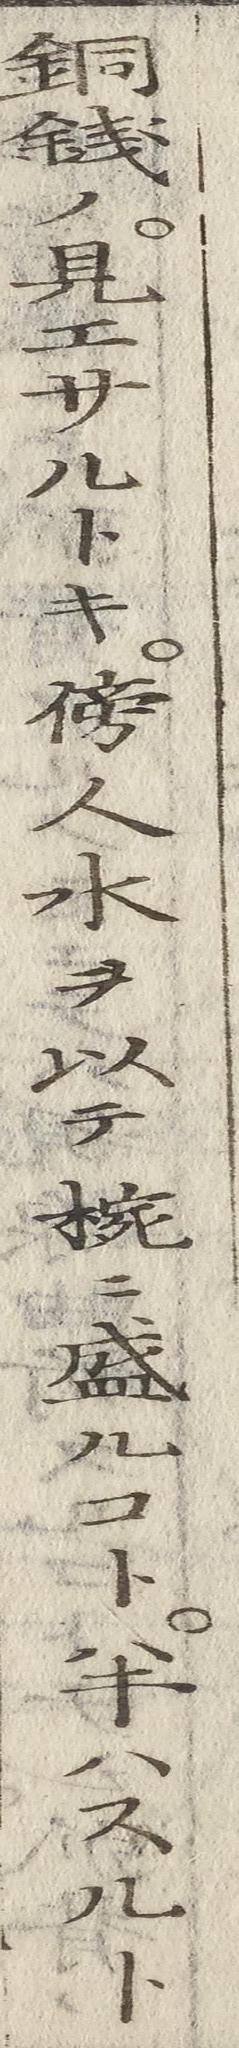銅銭ノ。見エサルトキ。傍人水ヲ以テ椀ニ盛ルコト。半ハスルト
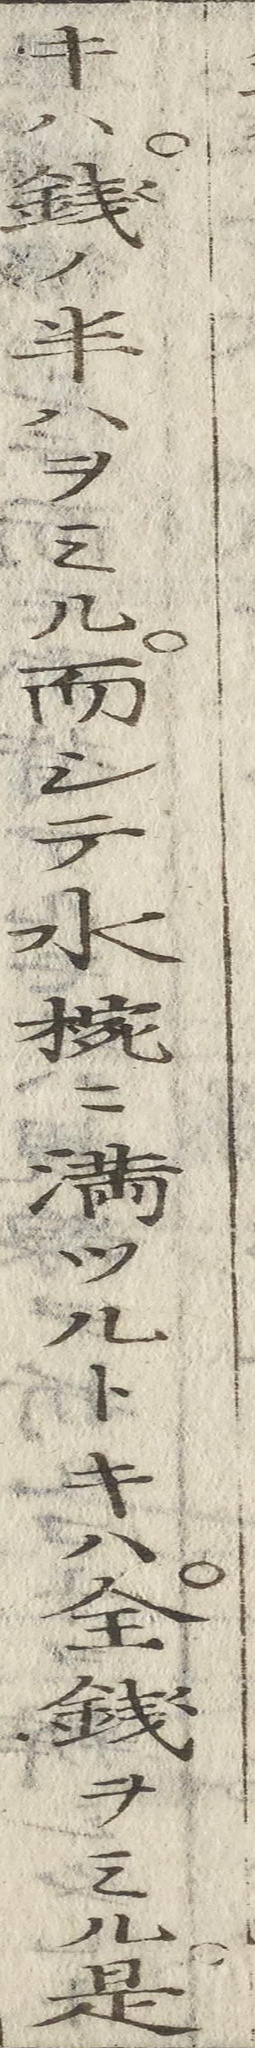キハ。銭ノ半ハヲミル。而シテ水椀ニ満ツルトキハ。全銭ヲミル。是
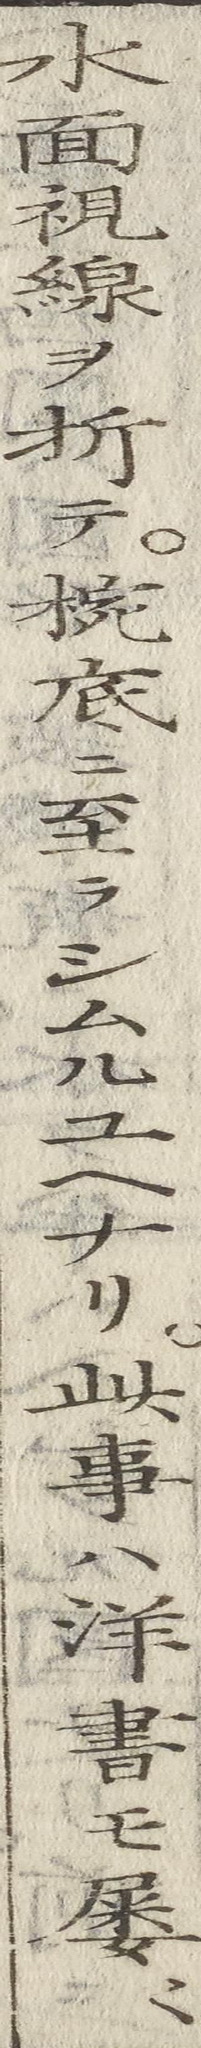水面視線ヲ折テ。椀底ニ至ラシムルユヘナリ。此事ハ洋書モ屡〳〵
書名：護法新論　上
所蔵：東京大学地震研究所図書室 Earthquake Research Institute Library, The University of Tokyo, JAPAN
